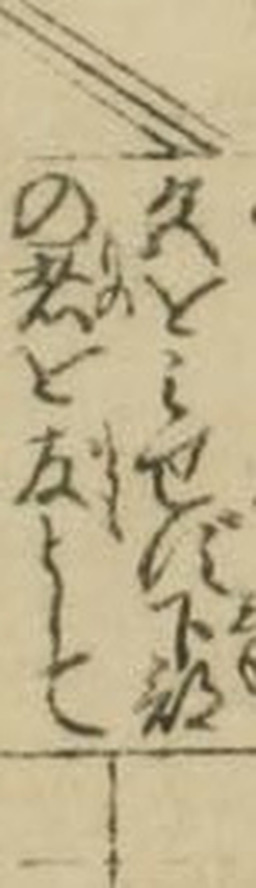の者を友として
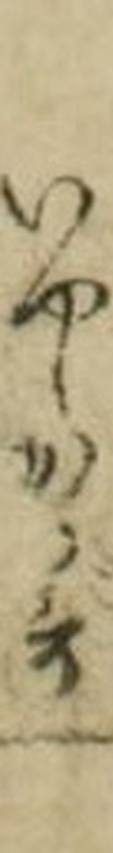いやしからず
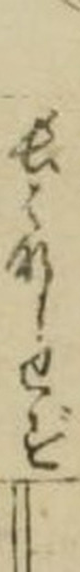長はなしせず
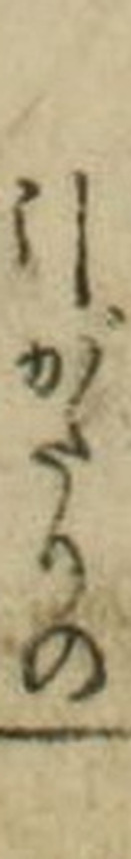引。かたりの
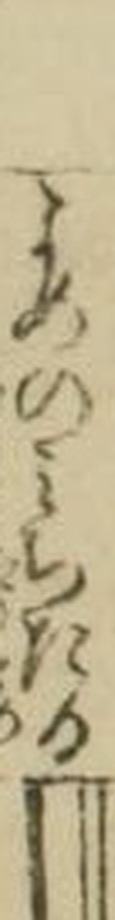よめのみちたる
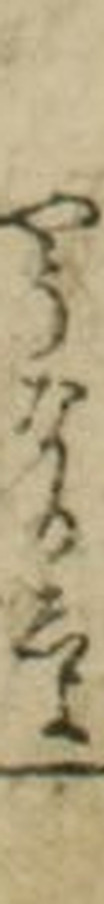やうなるしよ
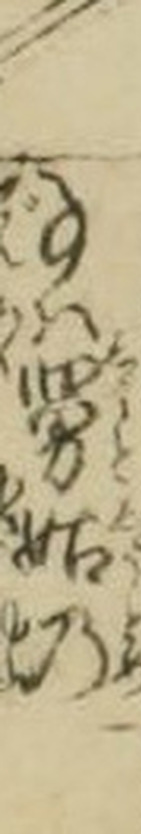事は舅姑の
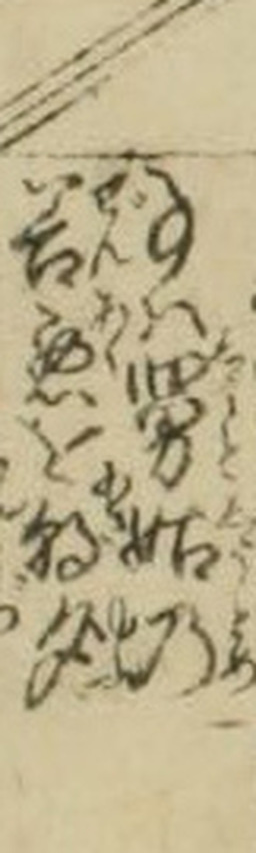善悪を朝夕
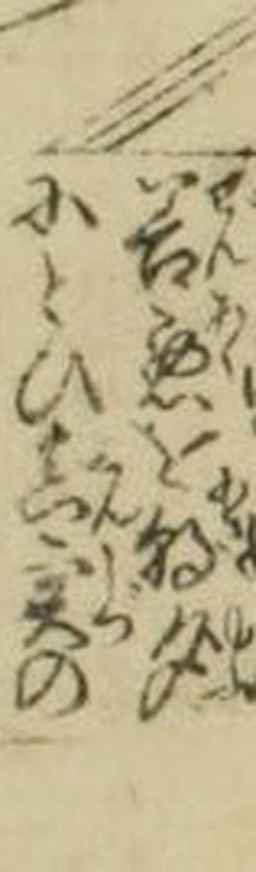にとひ真実の
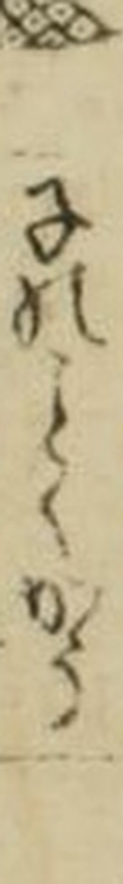子のことくかう
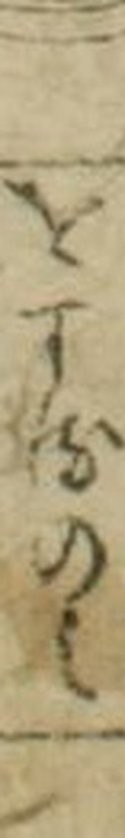をするのみ
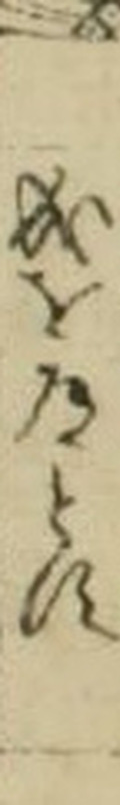成を道とす
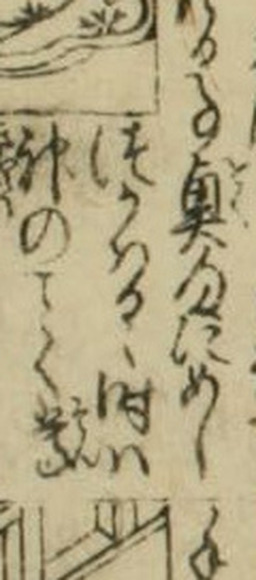つかはるゝ時は
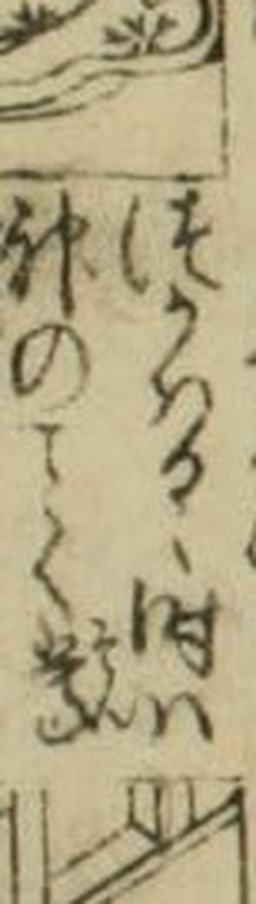神のごとく尊
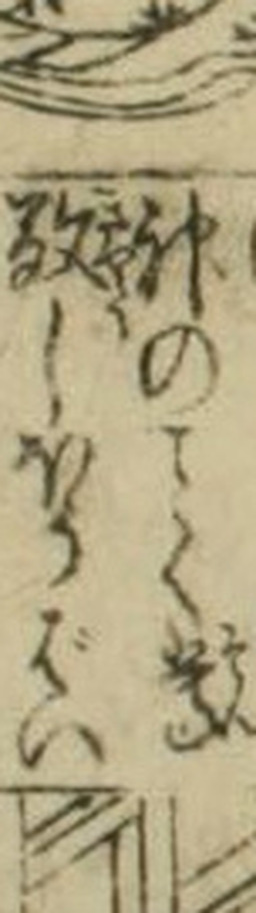敬しほうばい
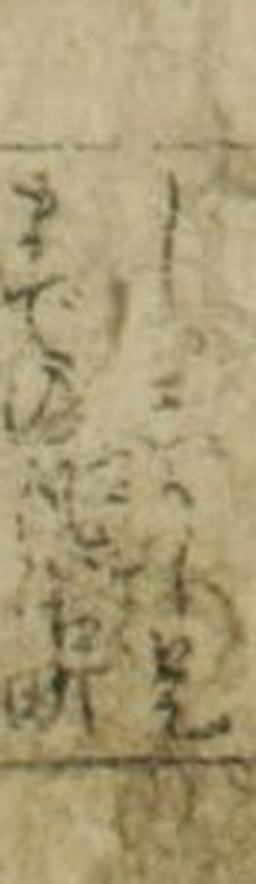までの。風俗町
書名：女源氏教訓鑑
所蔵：東京学芸大学附属図書館
